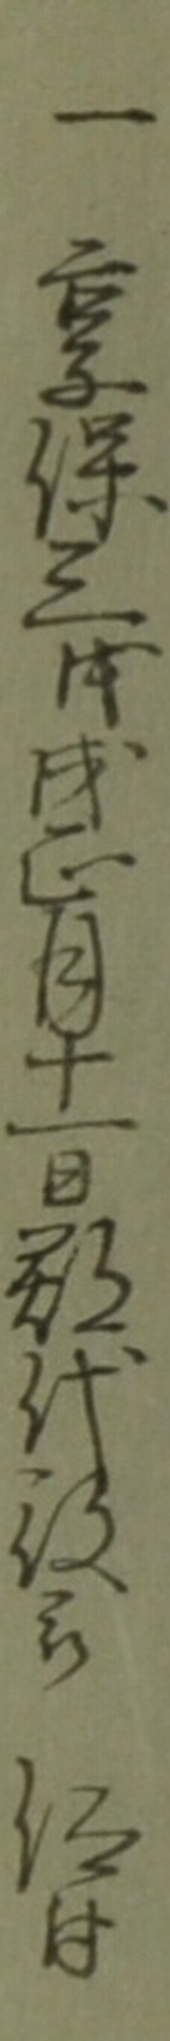一享保三戊戌正月十一日郡代役被仰付
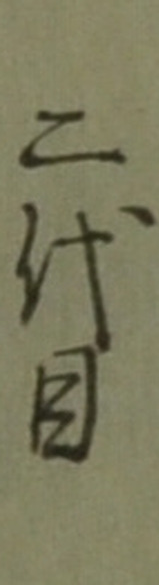二代目
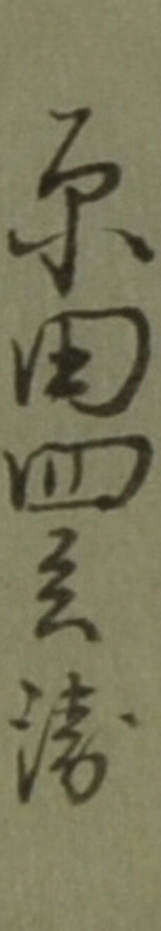原田四兵衛
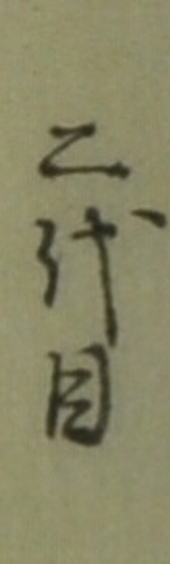二代目

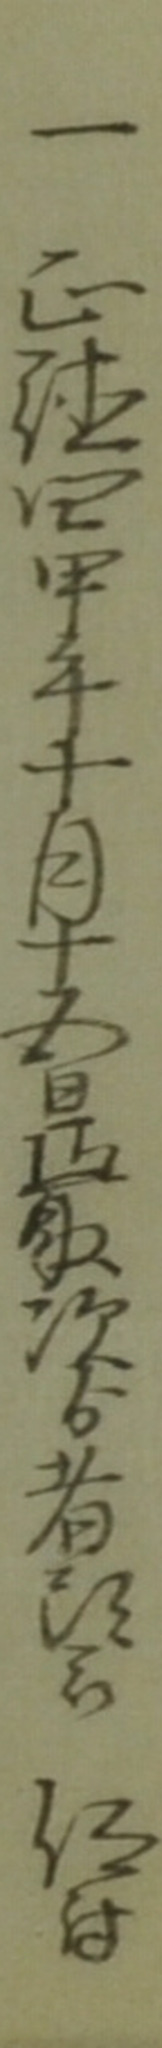一正徳四甲午十月十五日御取次ゟ者頭被仰付
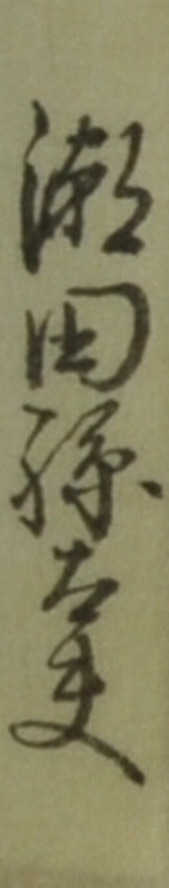瀬田孫太夫
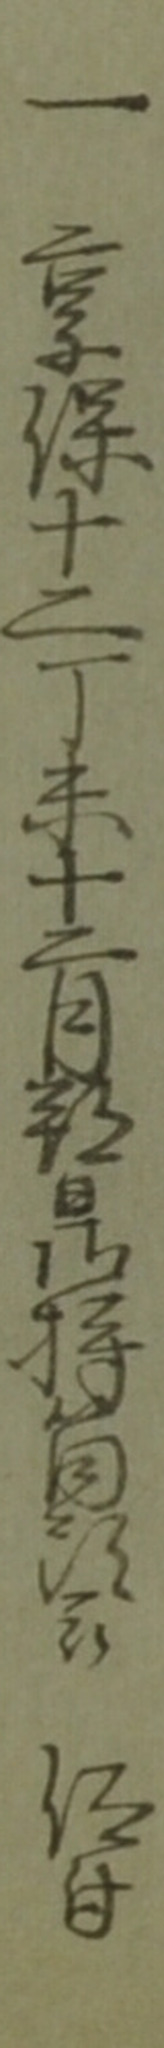一享保十二丁未十二月朔日御持筒頭被仰付
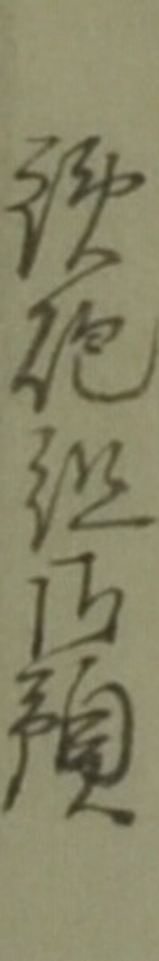鉄砲組御預
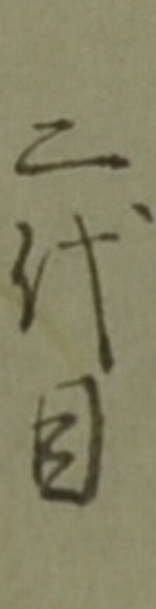二代目
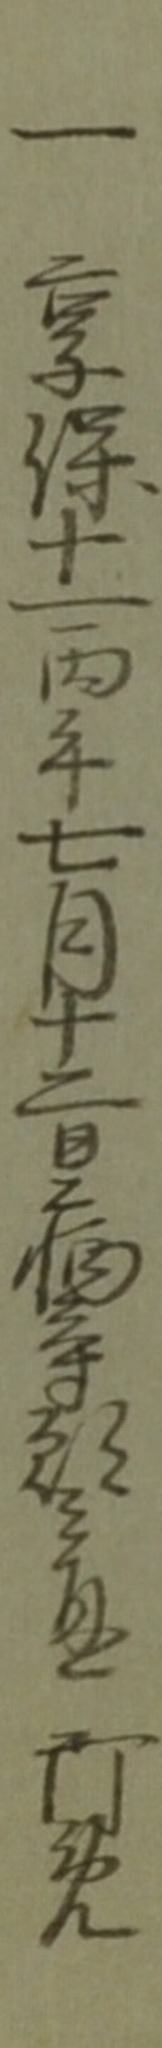一享保十一丙午七月十二日病気願之通御免
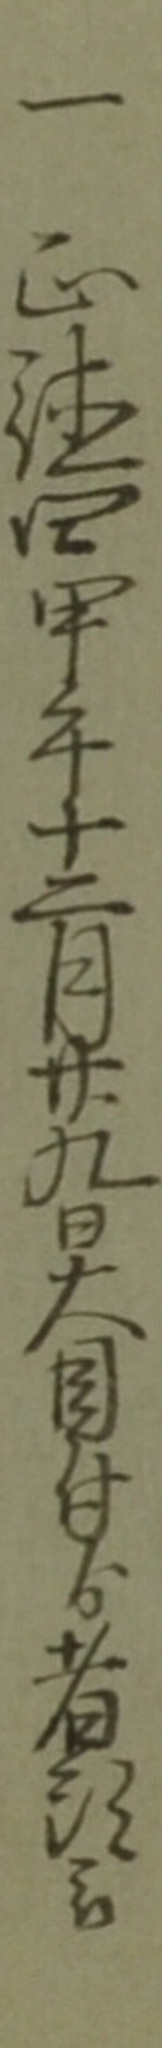一正徳四甲午十二月廿九日大目付ゟ者頭被
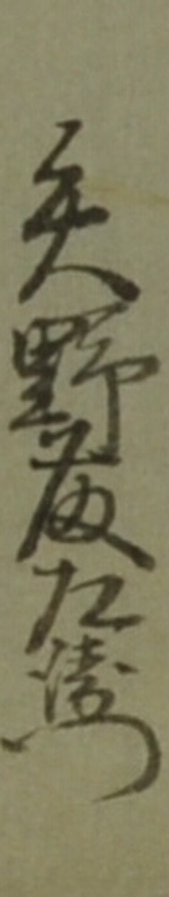矢野藤左衛門
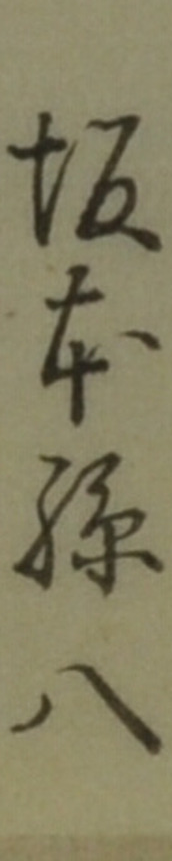坂本孫八
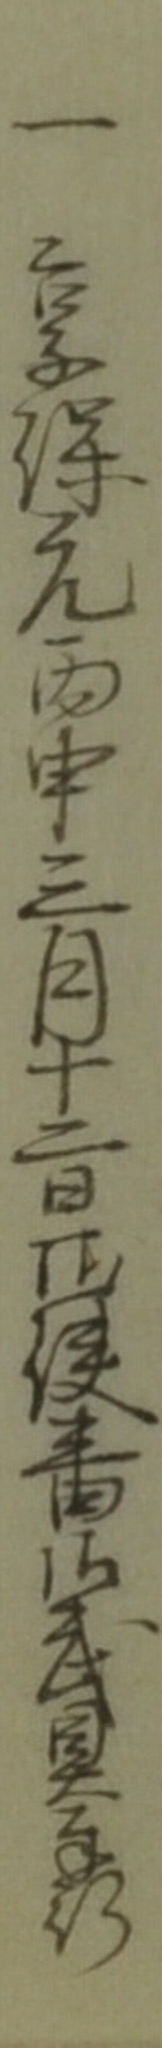一享保元丙申三月十二日御使番御武具奉行
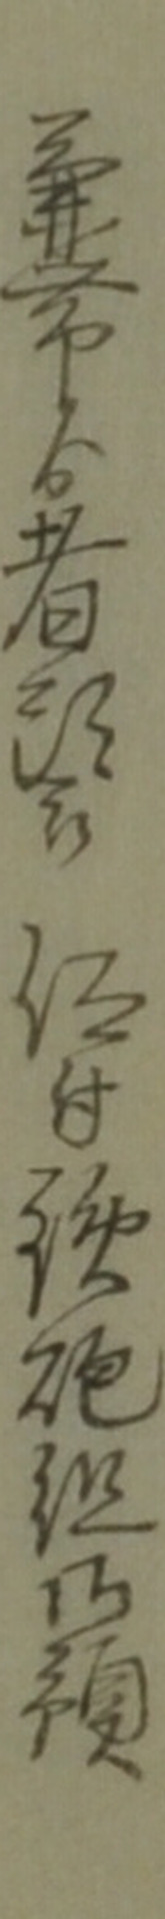兼帯ゟ者頭被仰付鉄砲組御預
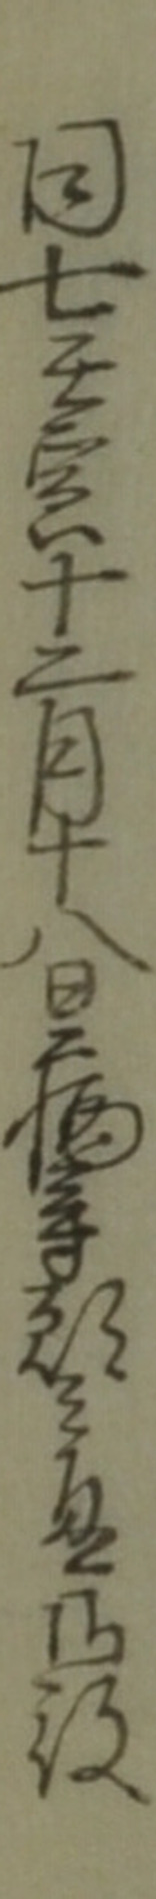一同七壬寅十二月十八日病気願之通御役
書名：諸御役代々録（二）
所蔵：伊那市立高遠町図書館・合同会社AMANE
